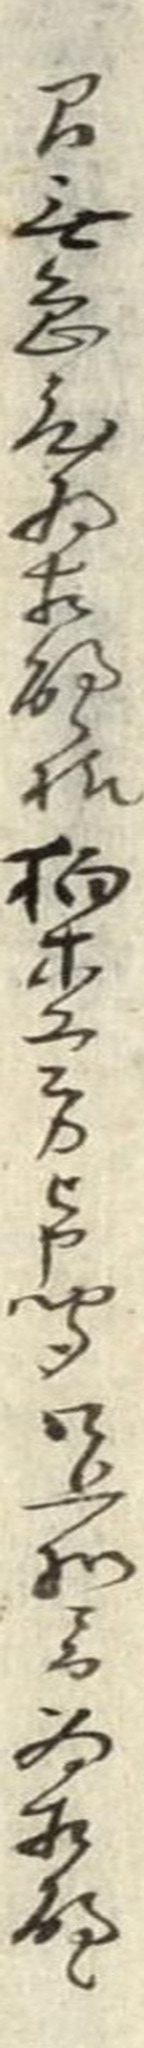間無急度為相触候様狛木工方被申聞口上控にて為相触候
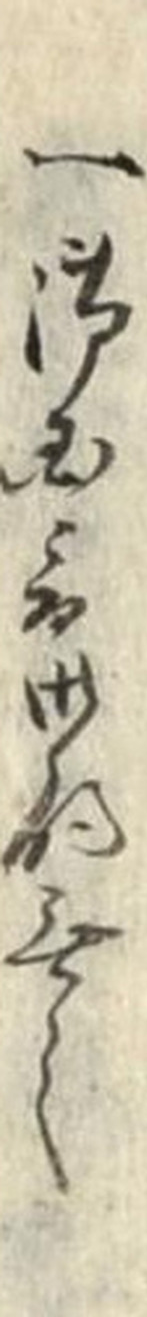一御国にて御触無之
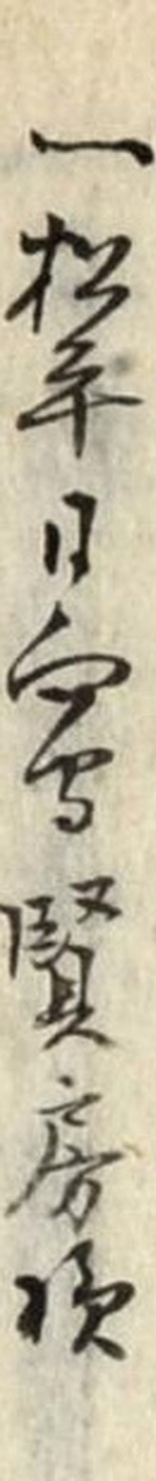一松平日向守賢房様
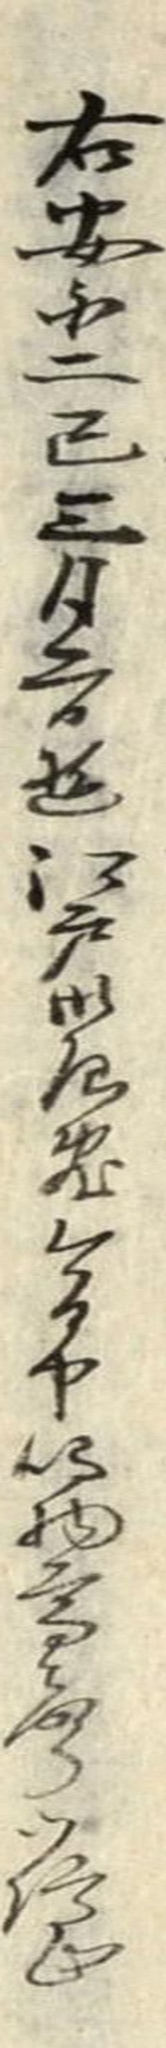右安永二巳三月二日逝江戸御屋敷今日中鳴物高声御停止
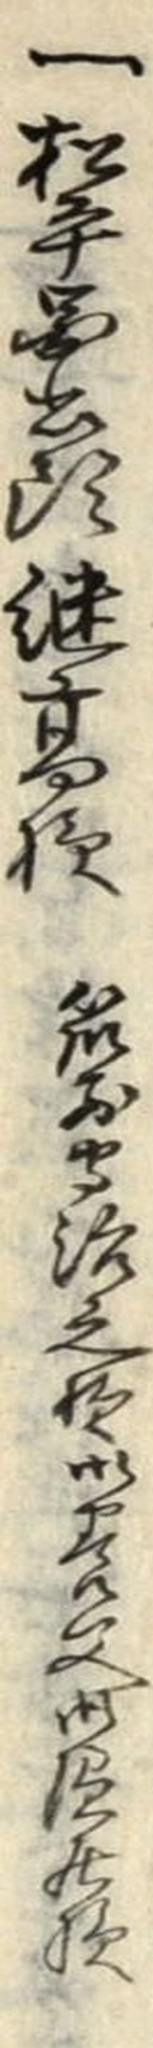一松平図書頭継高様筑前守治之様御養父御隠居様

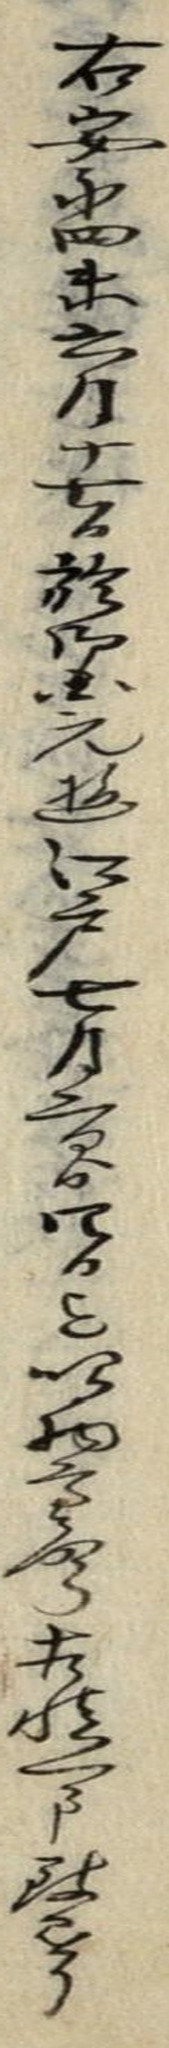右安永四未六月十七日於御国元逝江戸七月二日ゟ四日迄鳴物高声相慎可申致懸り
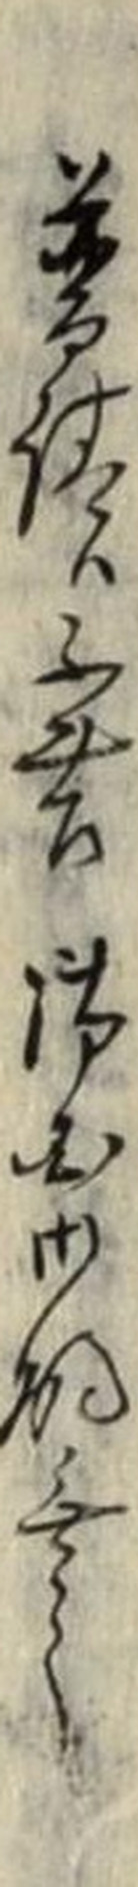普請は不苦御国御触無之
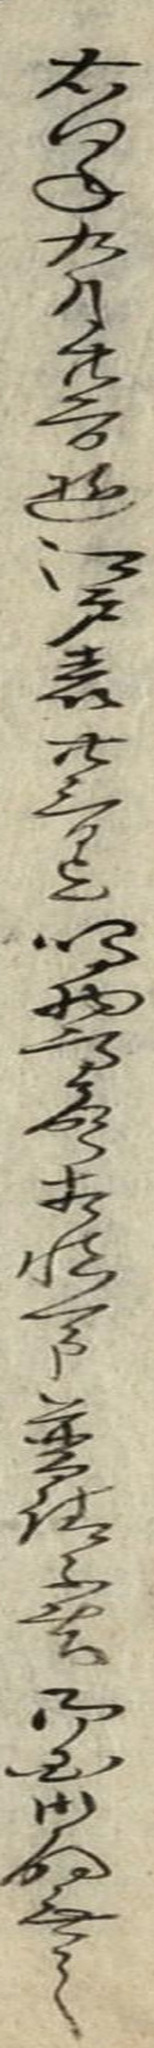右同年九月廿二日逝江戸表廿三日迄鳴物高声相慎可申普請不苦御国御触無之
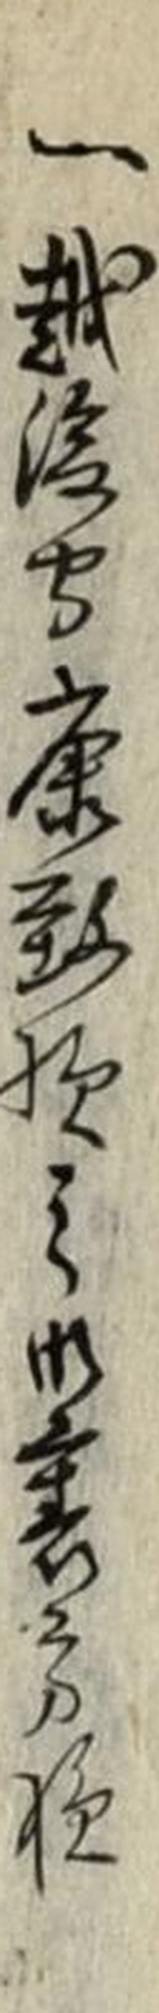一越後守康致様之御裏方様
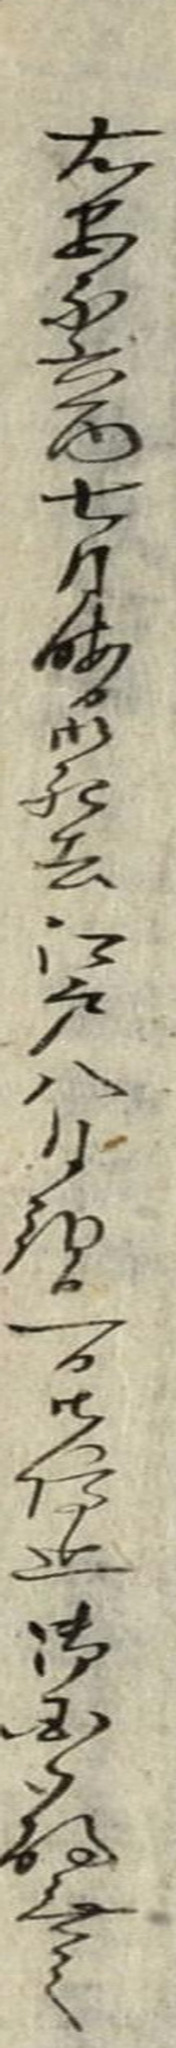右安永六酉七月晦日御死去江戸八月朔日一日御停止御国御触無之
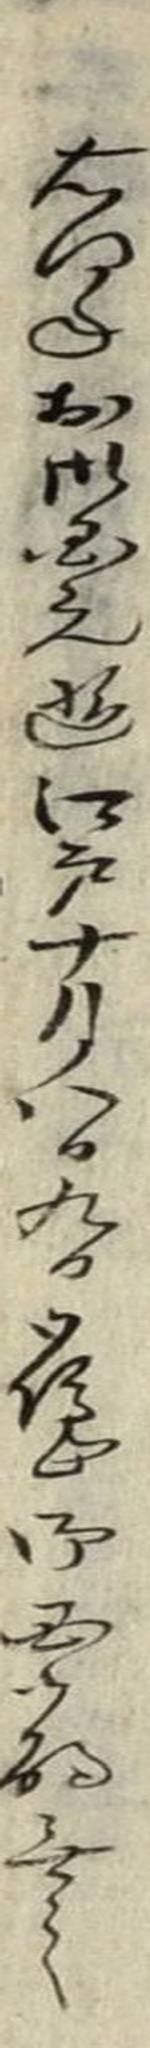右同年於御国元逝江戸十月八日九日御停止御国御触無之
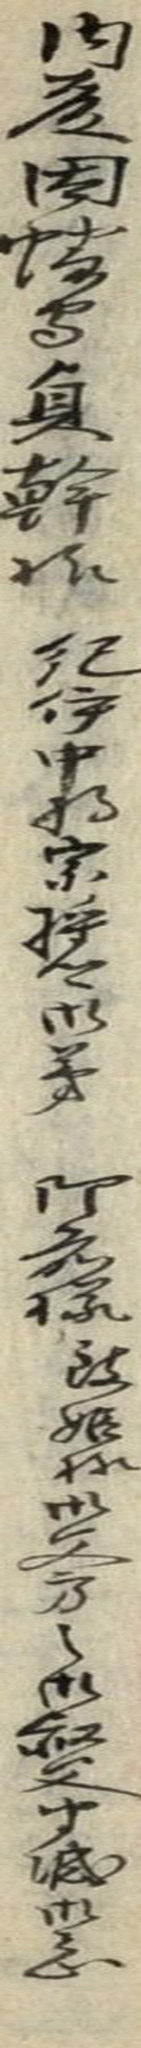一内藤因幡守貞幹様紀伊中将宗将卿御弟御前様致姫様御父方之御叔父半減御忌
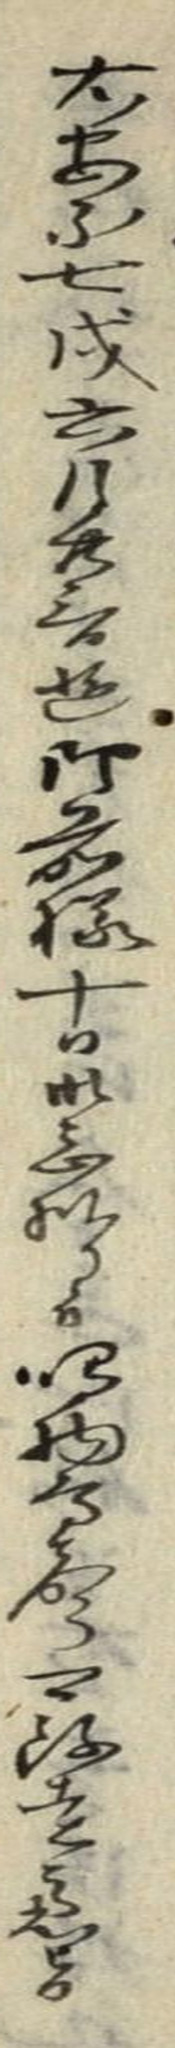右安永七戌六月廿三日逝御前様十日御忌掛りに付鳴物高声可致遠慮旨
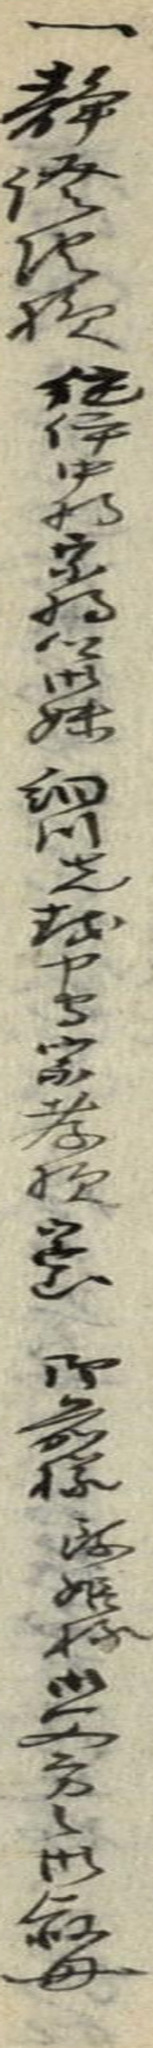一静証院様紀伊中将宗将卿御妹細川先越中守宗孝様御室御前様致姫様御父方之御叔母
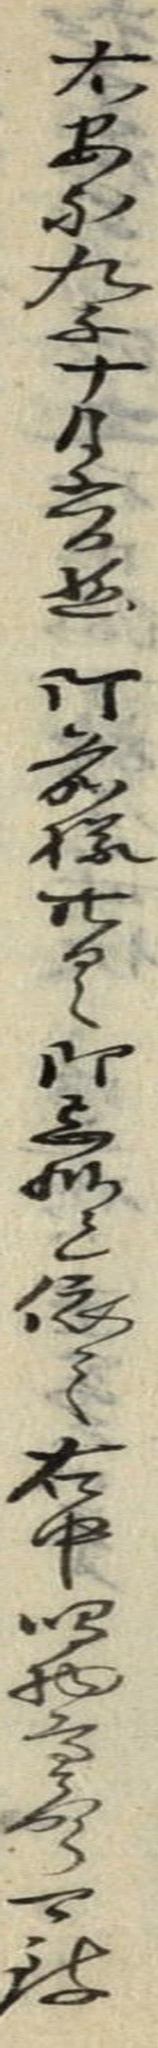右安永九子十月六日逝御前様廿日之御忌掛也依之右中鳴物高声可致
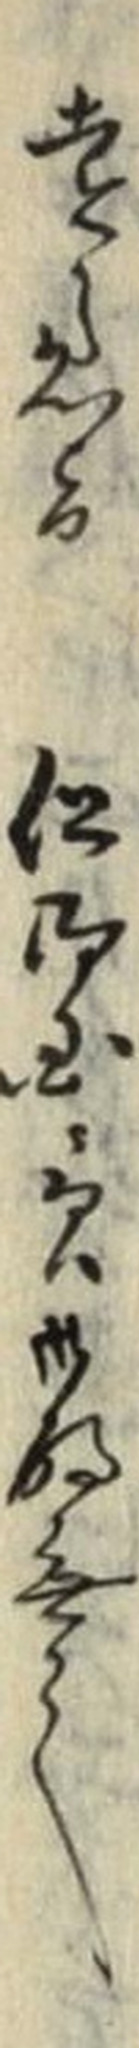遠慮旨但御国にては御触無之
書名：御停止異変死失
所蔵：福井県文書館 Fukui Prefectural Archives
